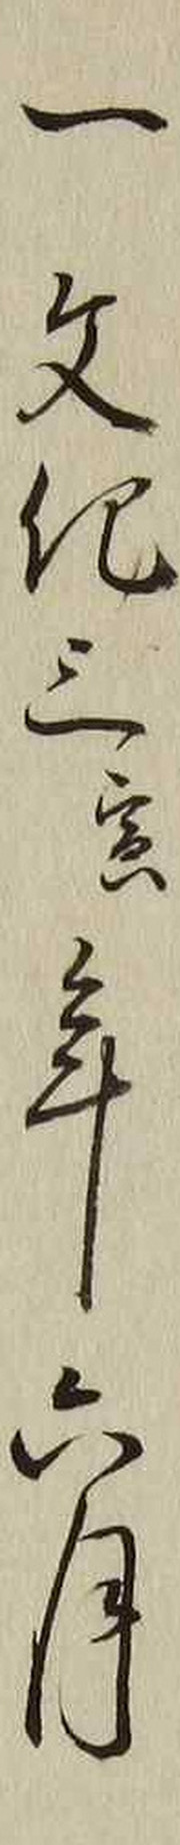一文化三寅年六月
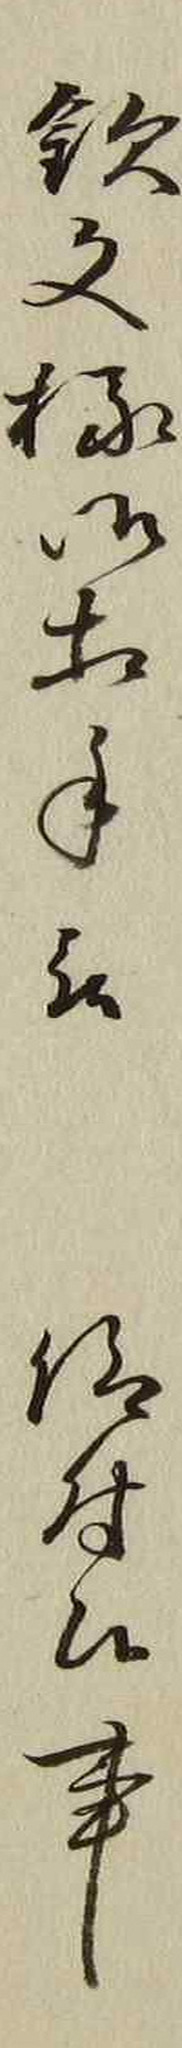欽文様御相手被仰付候事
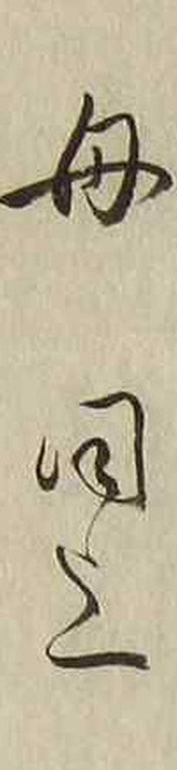母同上

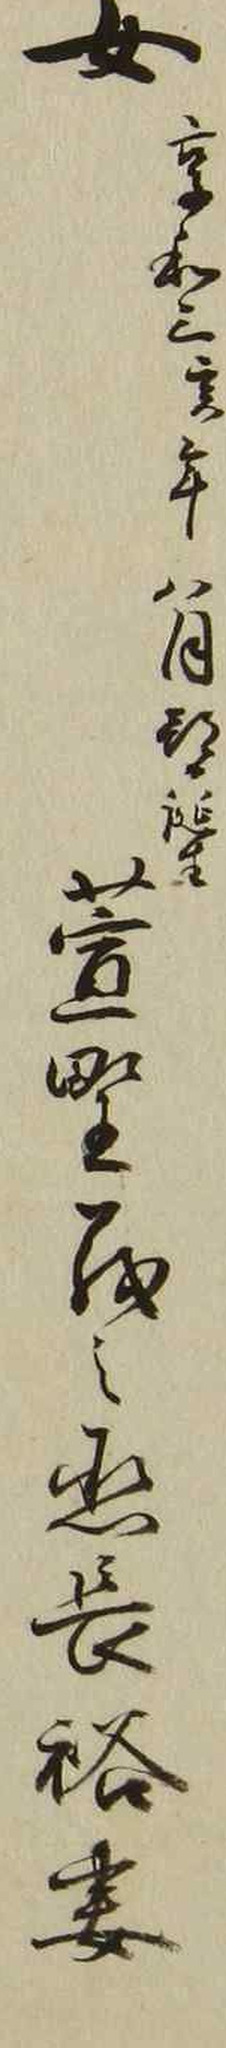萱野義之丞長裕妻
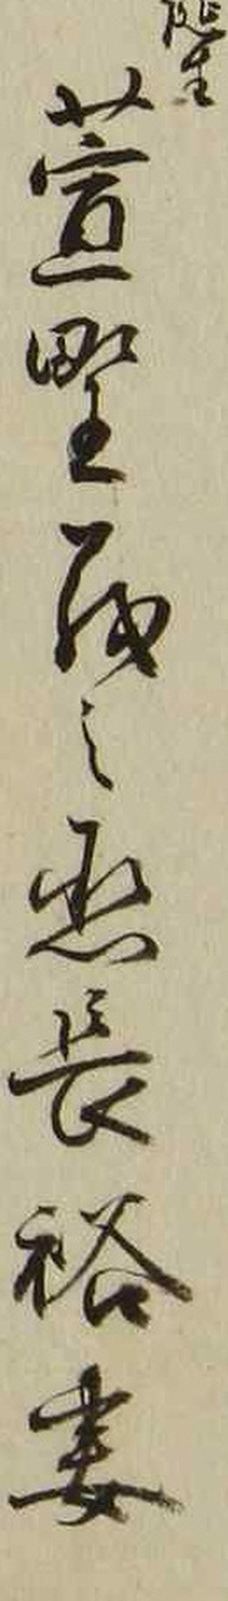萱野義之丞長裕妻
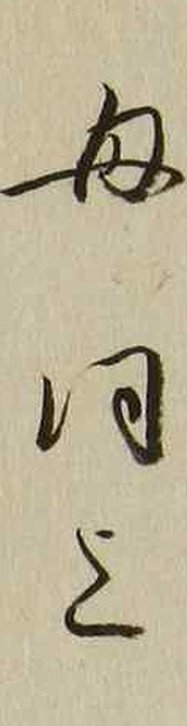母同上
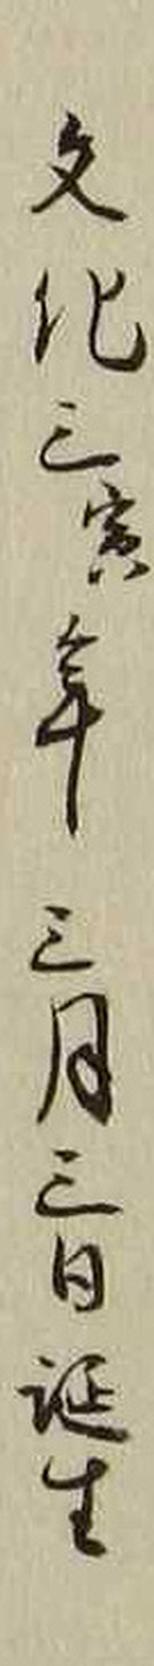文化三寅年三月三日誕生
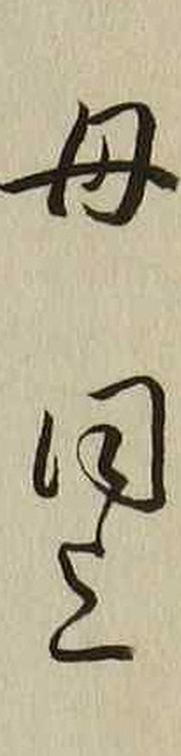母同上
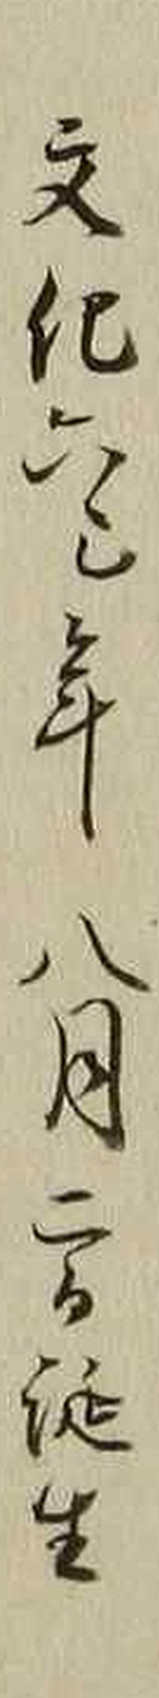文化六巳年八月二日誕生
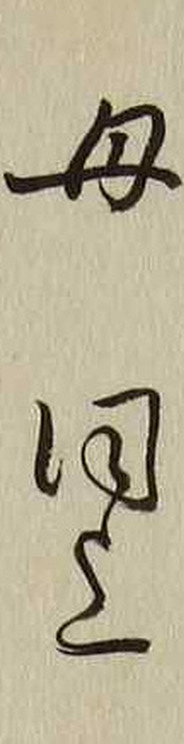母同上
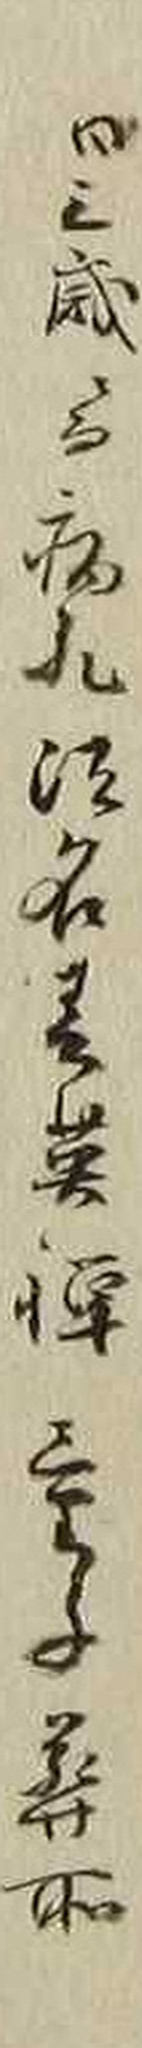日三歳ニ而病死法名春英禅童子葬所
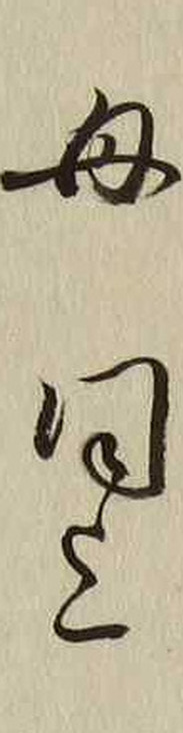母同上
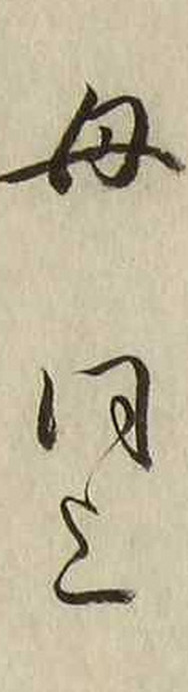母同上
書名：諸士系譜　巻之2　い之部2
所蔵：会津若松市立会津図書館
